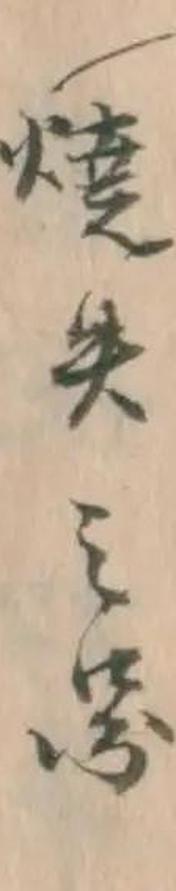焼失之図

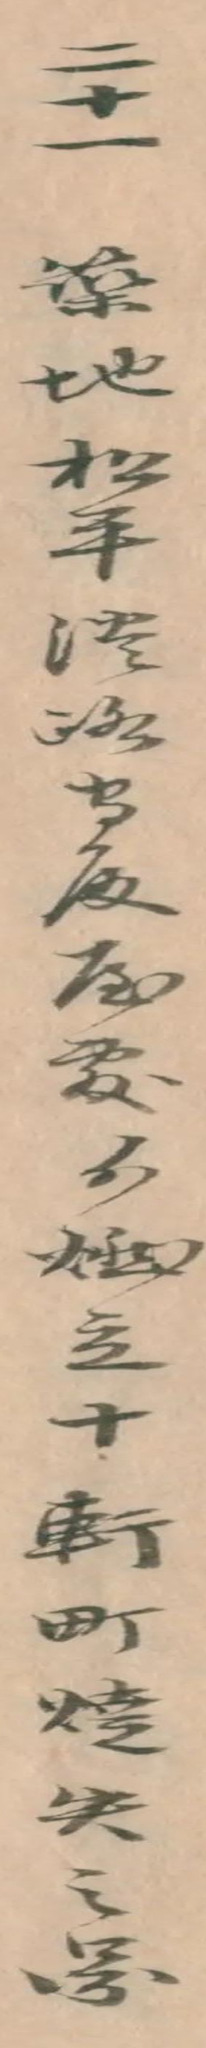二十一築地松平淡路守殿屋敷ゟ燃立十軒町焼失之図
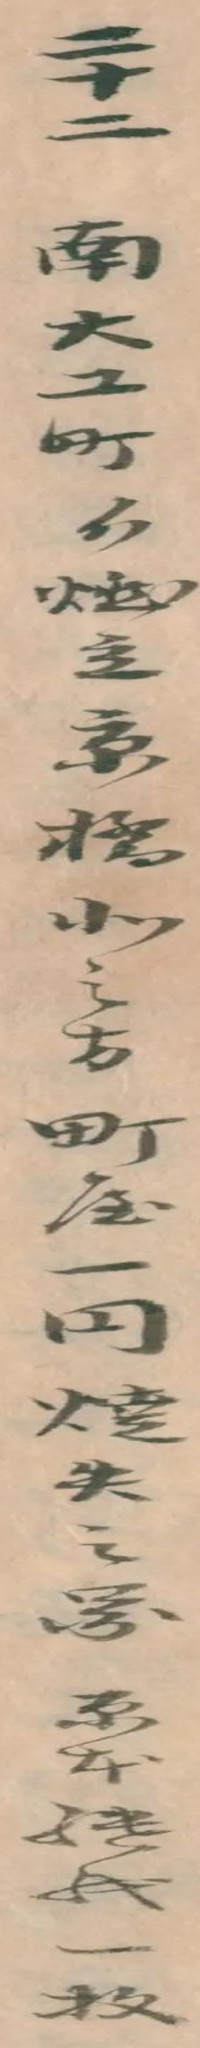二十二南大工町ゟ燃立京橋北之方町屋一円焼失之図原本繾紙一枚
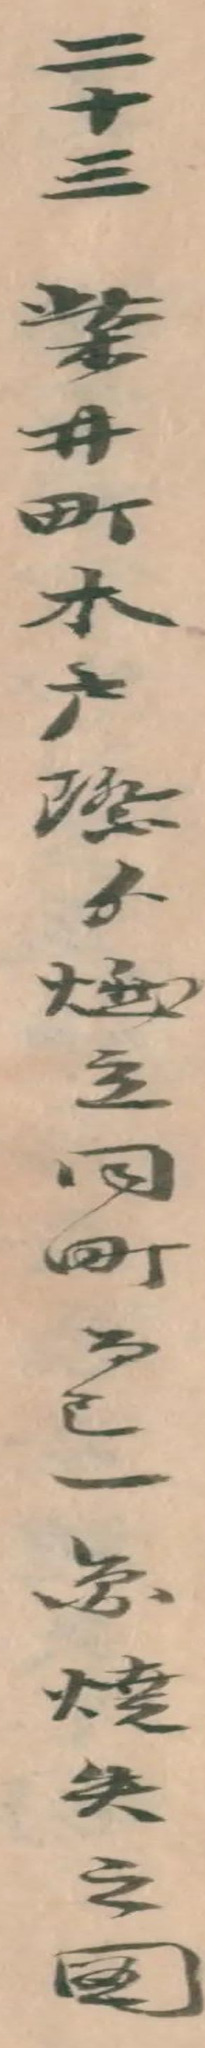二十三柴井町木戸際ゟ燃立同町而已一円焼失之図

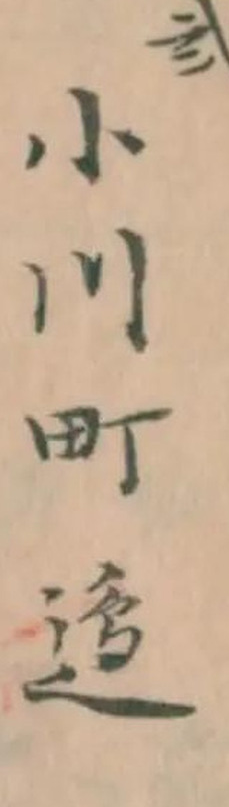小川町辺

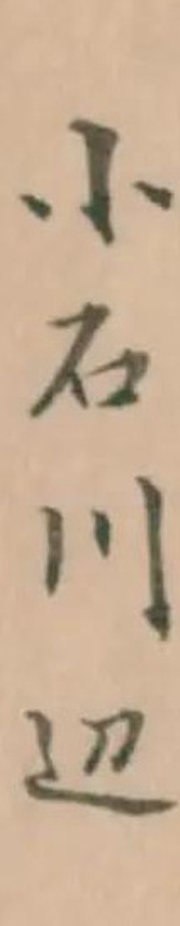小石川辺

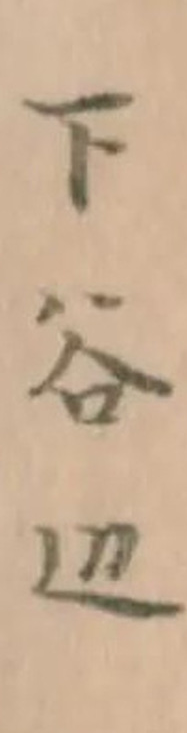下谷辺

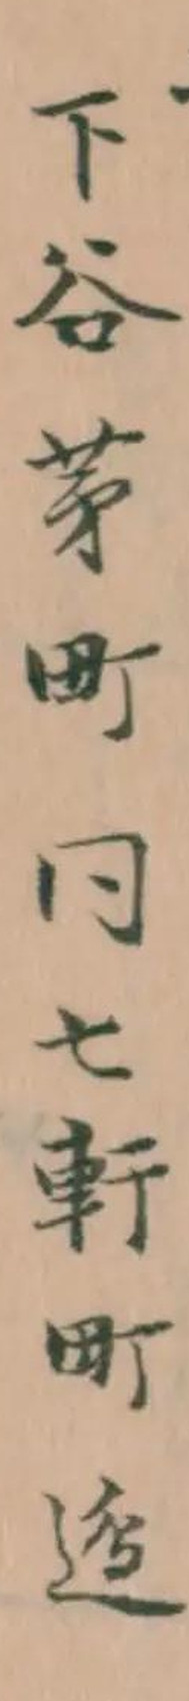下谷茅町同七軒町辺

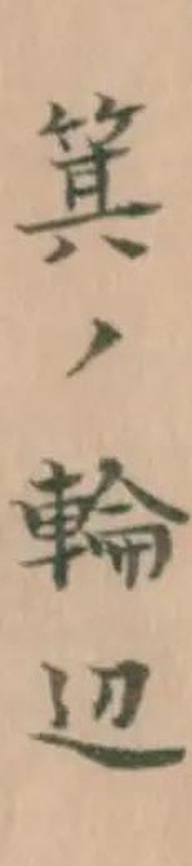箕ノ輪辺

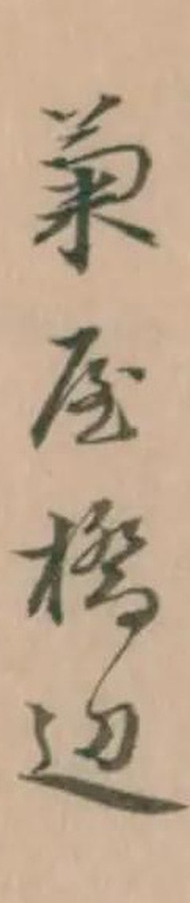菊屋橋辺

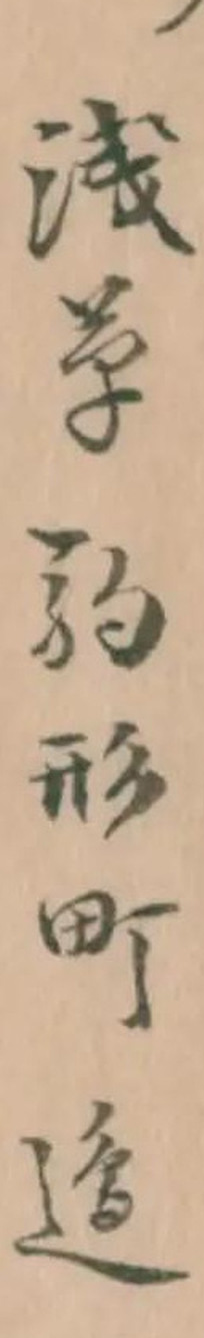浅草駒形町辺
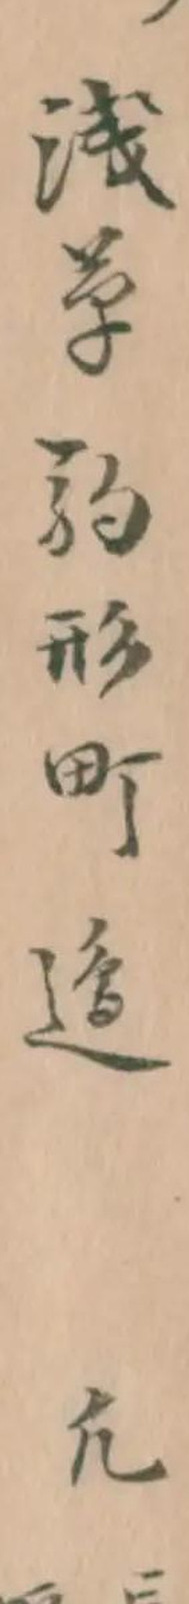浅草駒形町辺

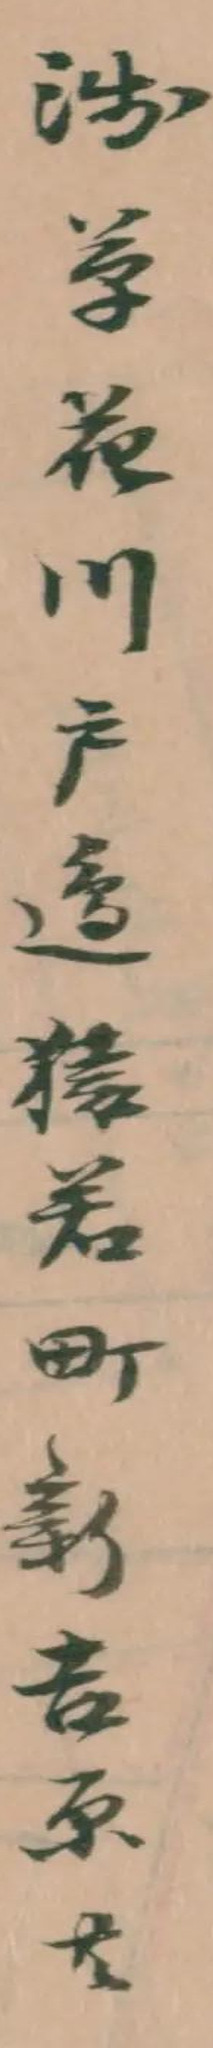浅草花川戸辺猿若町新吉原共
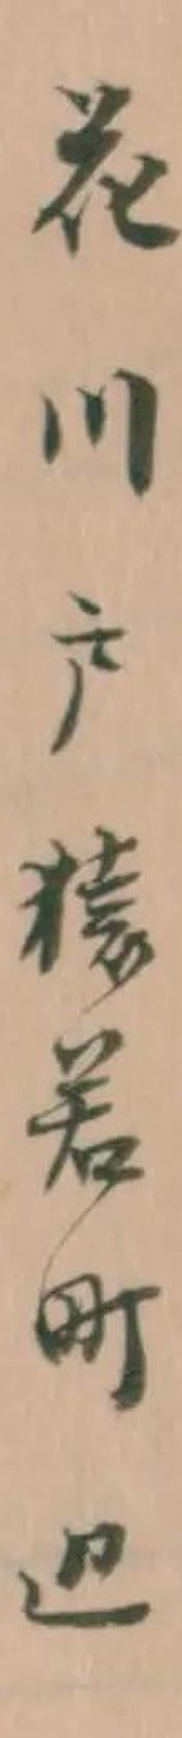花川戸猿若町辺
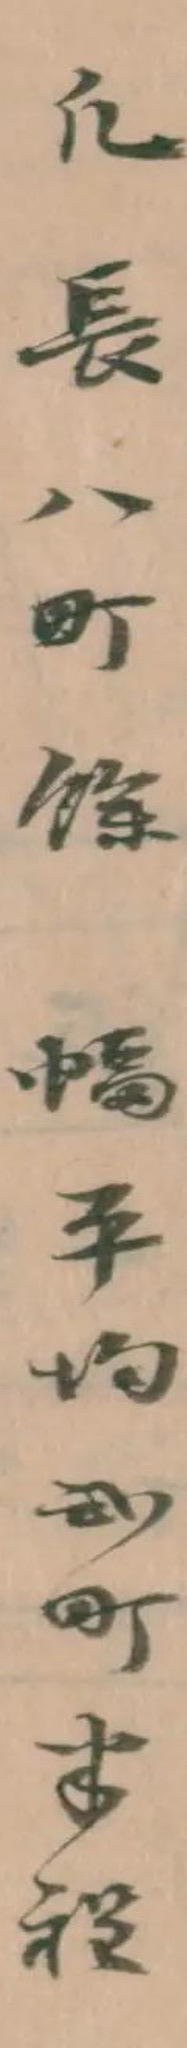凡長八町余幅平均弐町半程
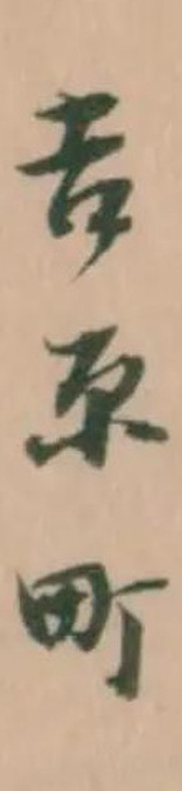吉原町
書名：地災撮要. 巻7-9(地震之部)
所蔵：国立国会図書館 National Diet Library, JAPAN
